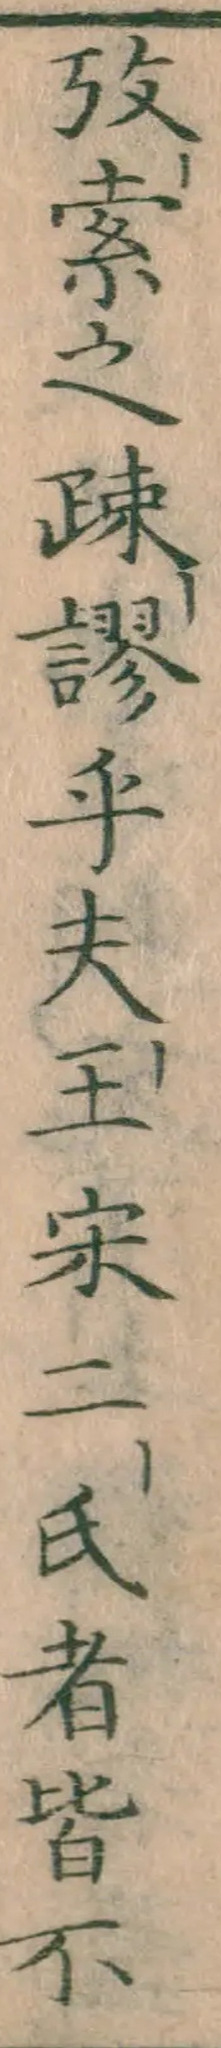攷-索之疎-謬乎夫-王宋二-氏者皆不
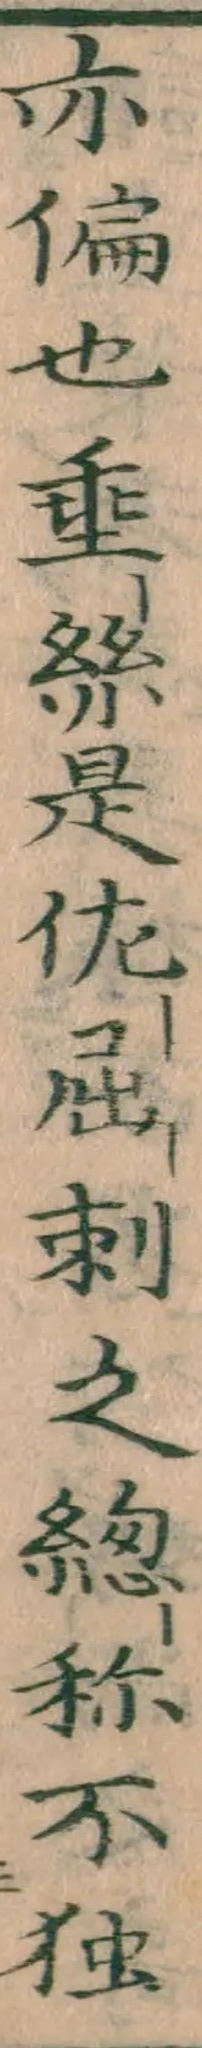亦偏也垂-糸是佐-屈-刺之総-称不独
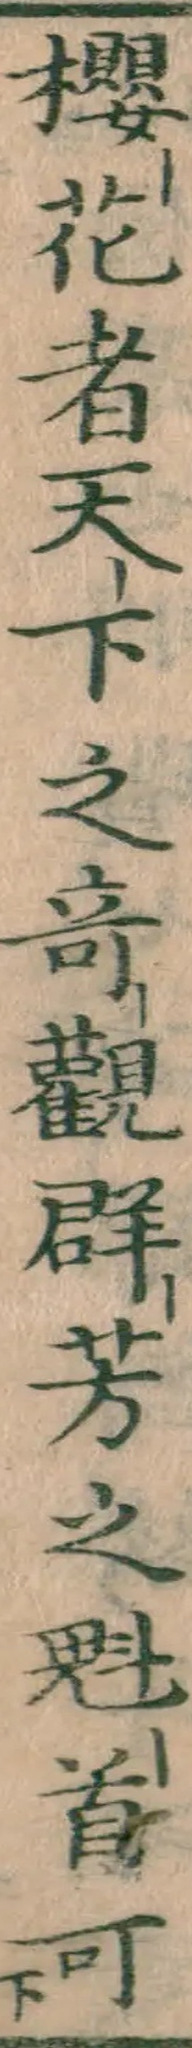桜-花者天-下之奇-観群-芳之魁-首可
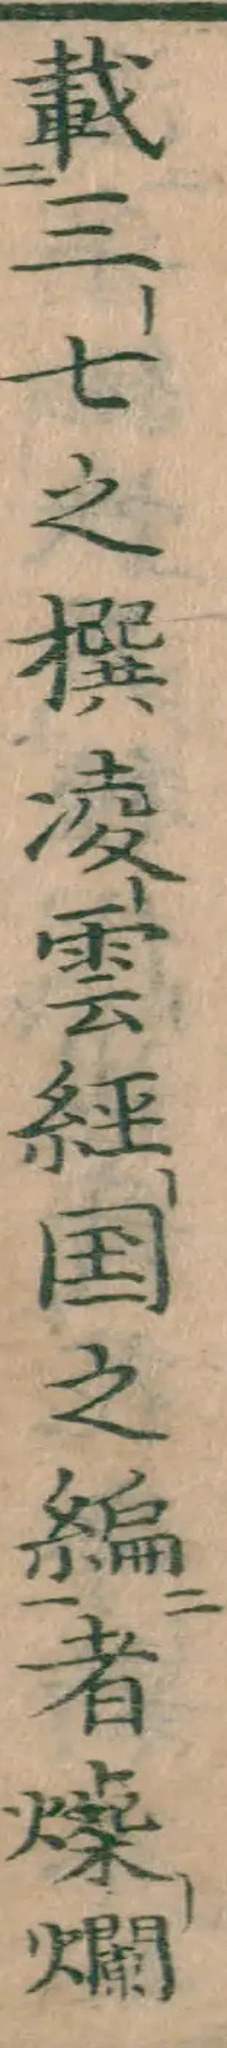載三-七之撰凌-雲経-国之編者燦-爛

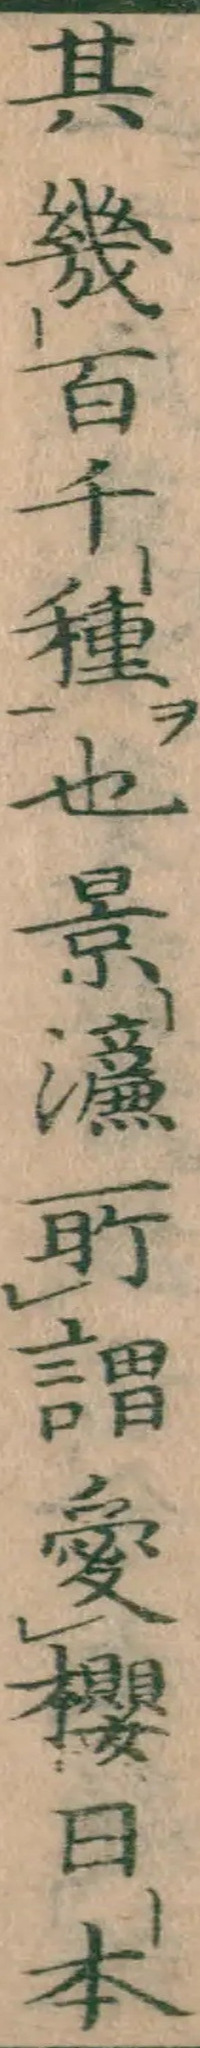其幾-百千-種也景-濓所謂愛桜日-本
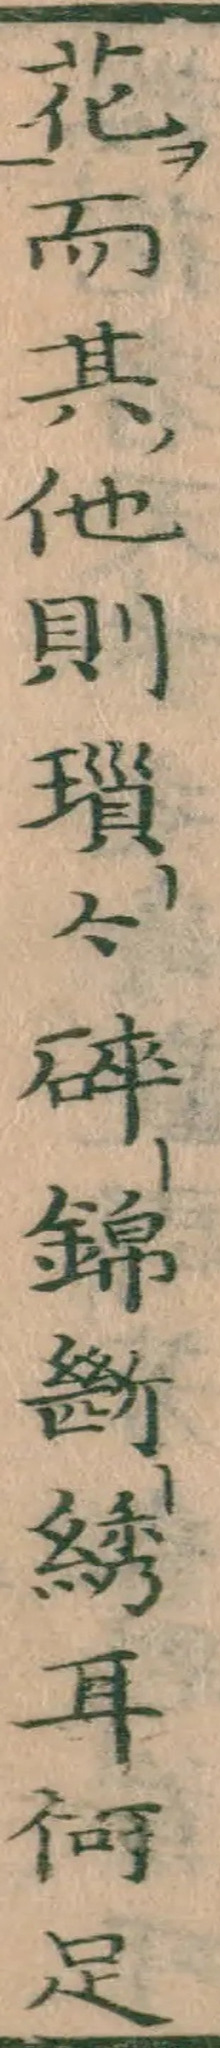花而其他則瑣-々砕-錦断-綉耳何足
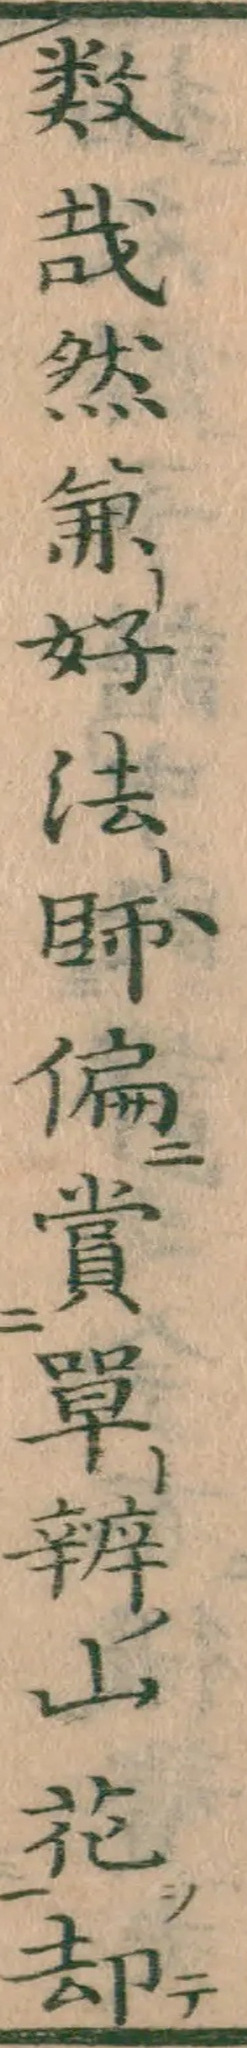数哉然兼-好法-師偏賞単-弁山花却
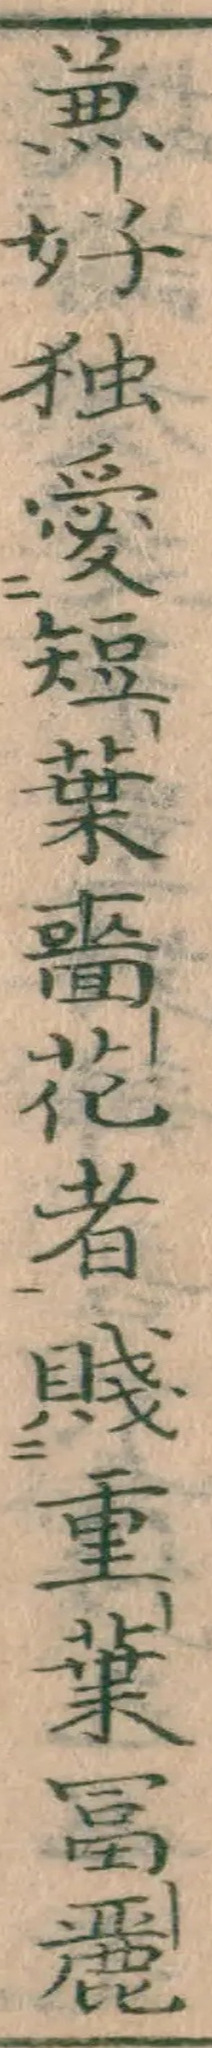兼-好独愛短-葉嗇-花者賤重-葉富-麗
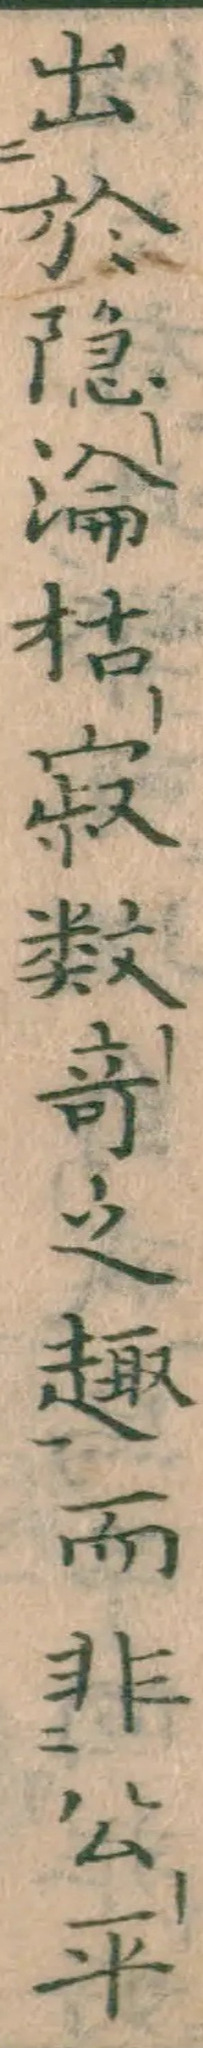出於隠-淪枯-寂数-奇之趣而非公-平

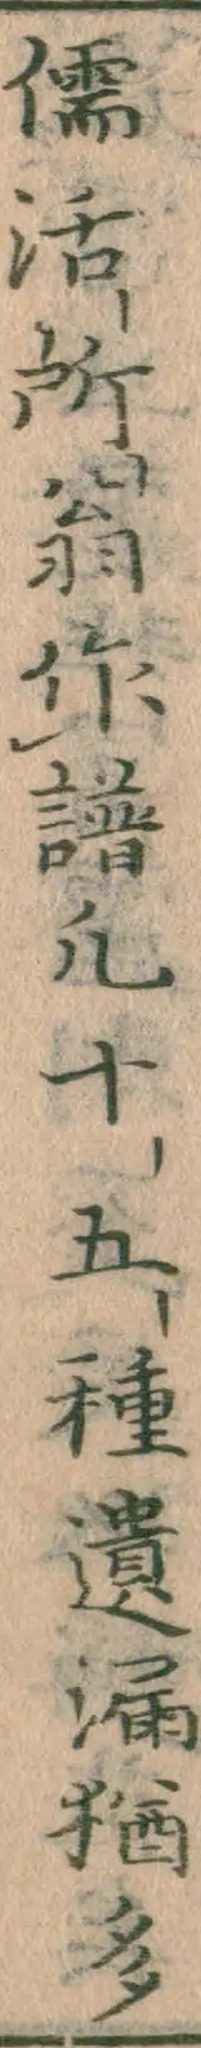儒活-所翁作譜凡十-五-種遺-漏猶多
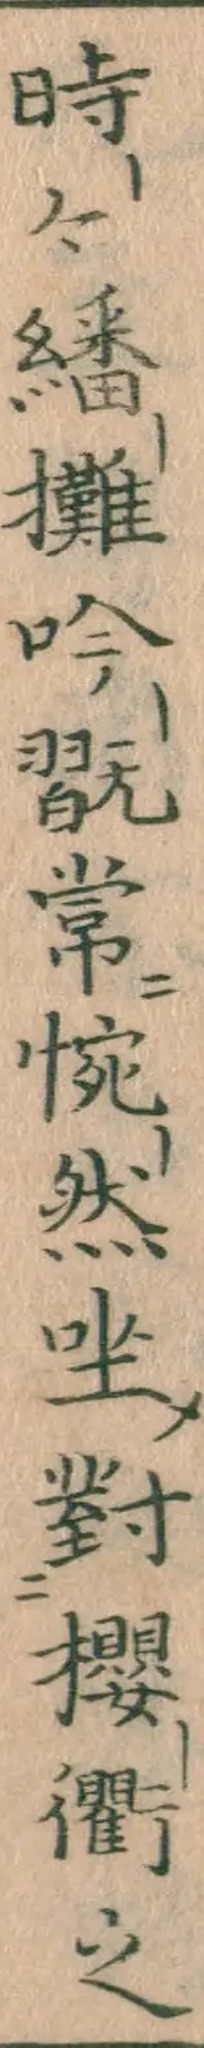時-々繙-攤吟-翫常惋-然坐対桜-衢之
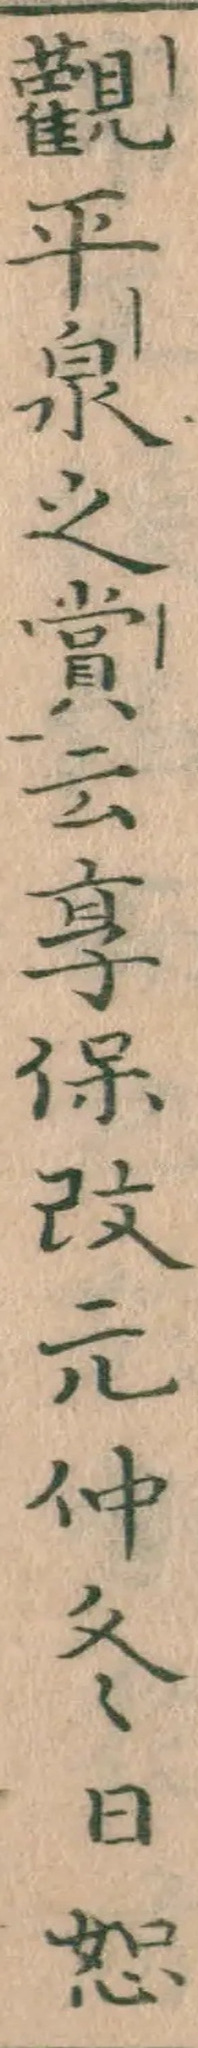-観平-泉之-賞云享保改元仲冬恕
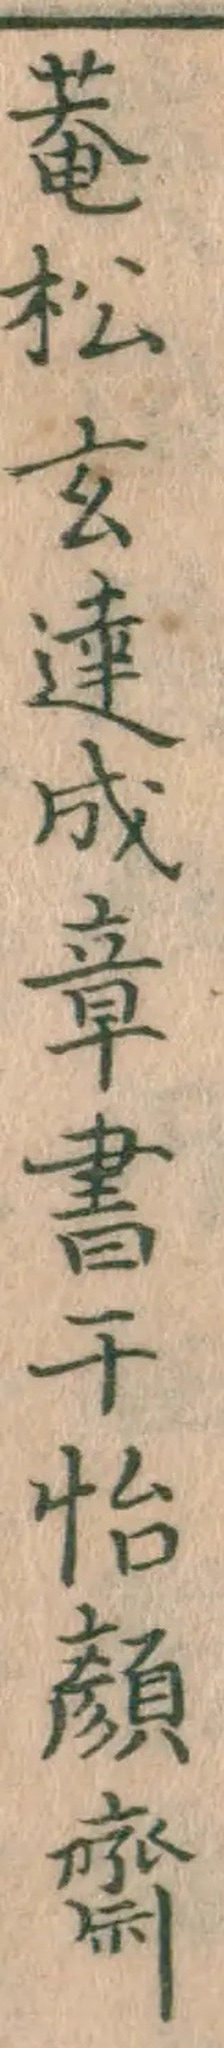菴松玄達成章書干怡顔斎

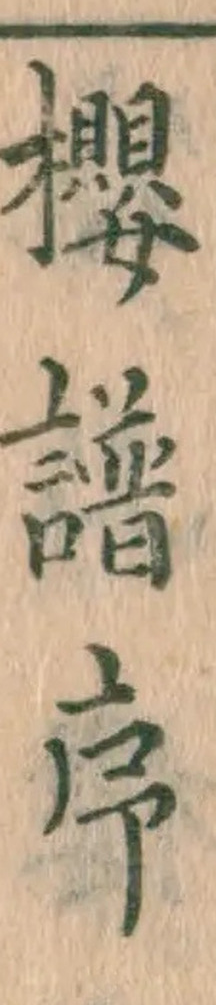桜譜序
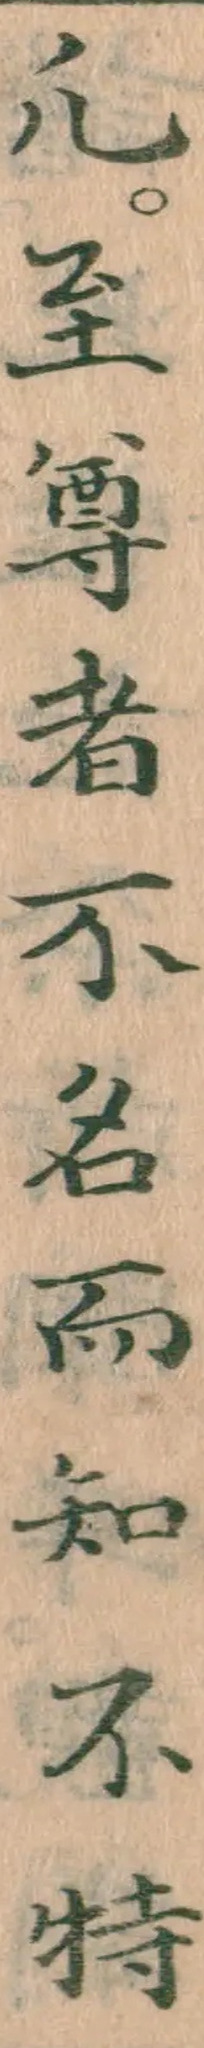凡。至尊者不名而知不特
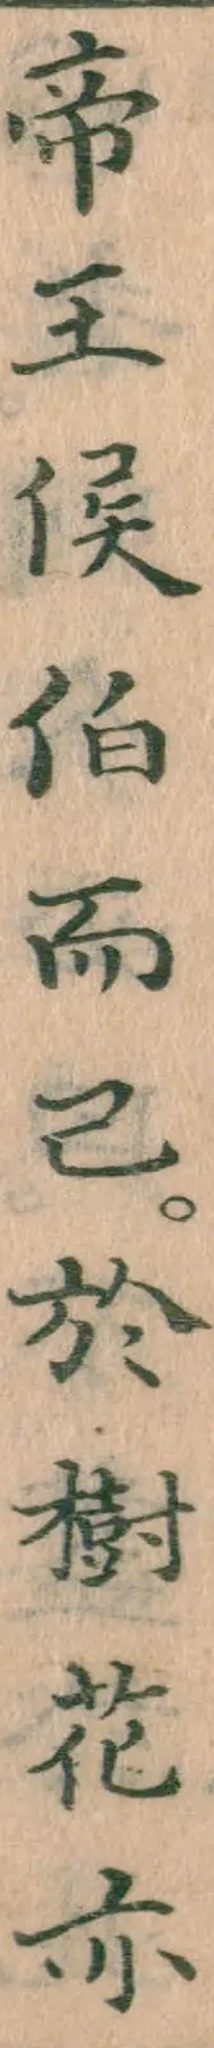帝王侯伯而已。於樹花亦
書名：怡顔齋櫻品
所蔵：国立国会図書館 National Diet Library, JAPAN
